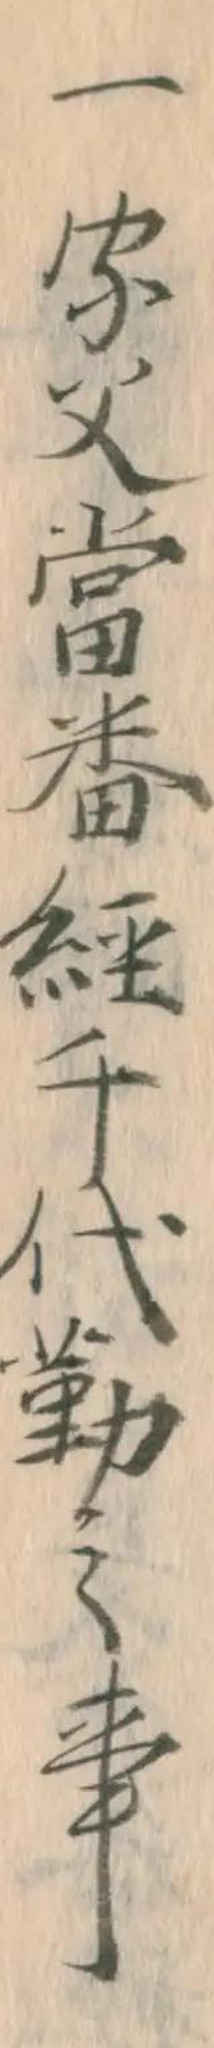一家父當番経千代勤之事
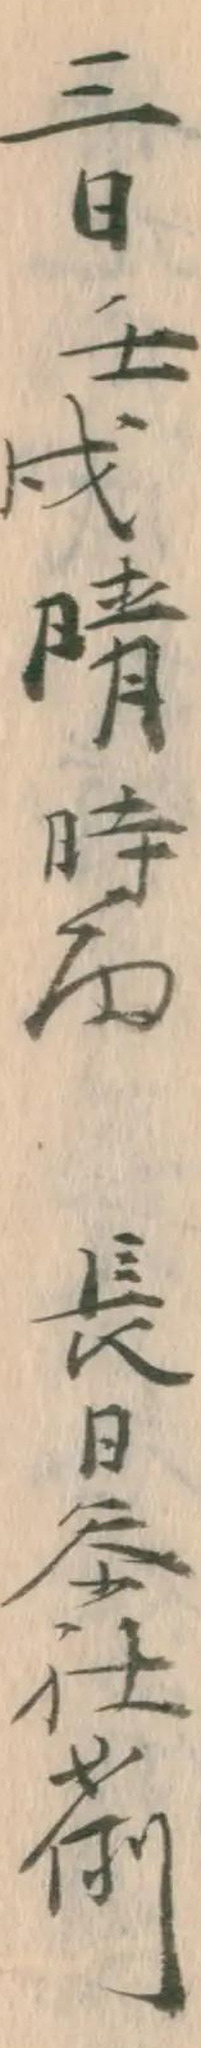三日壬戌晴時雨長日参社如例
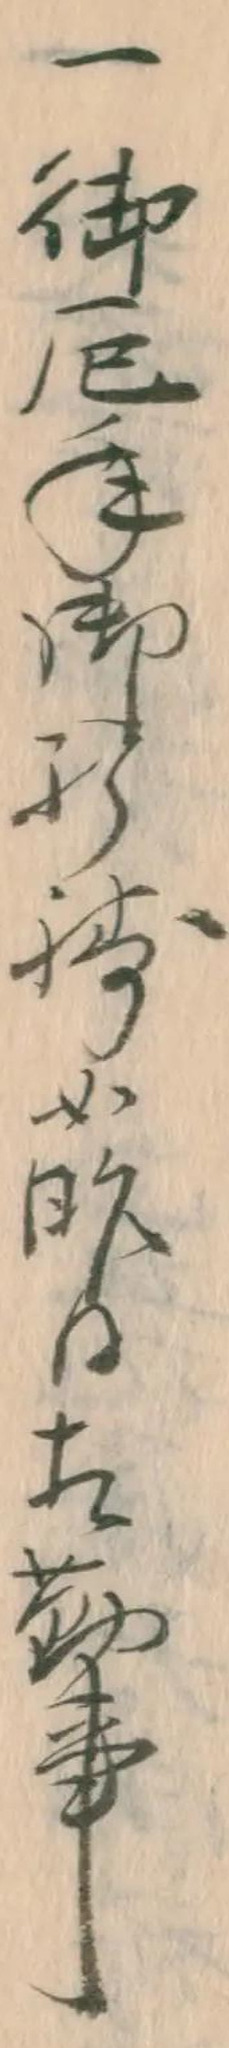一御厄年御祈祷如昨日相勤事
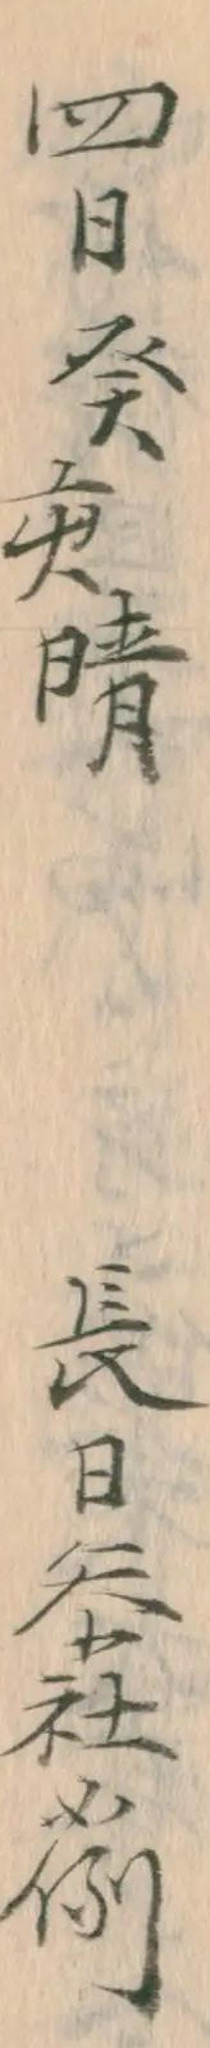四日癸亥晴長日参社如例
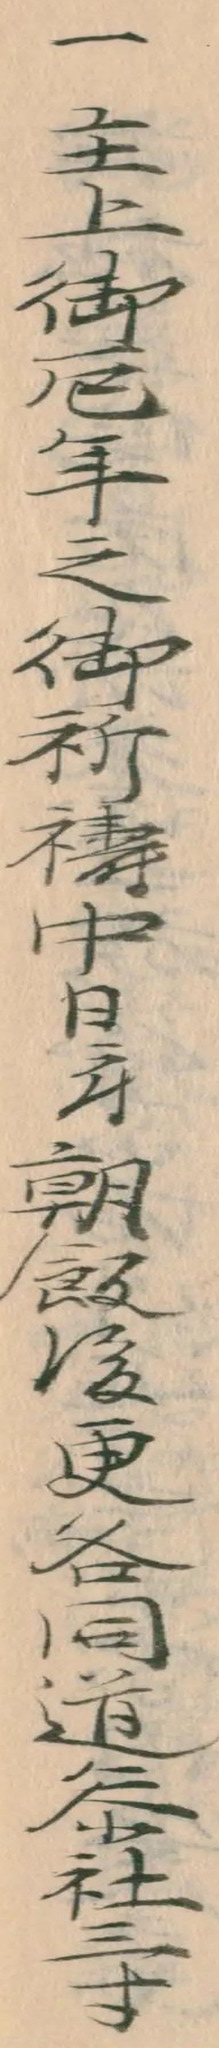一主上御厄年之御祈祷中日ニ付朝飯後更各同道参社三寸
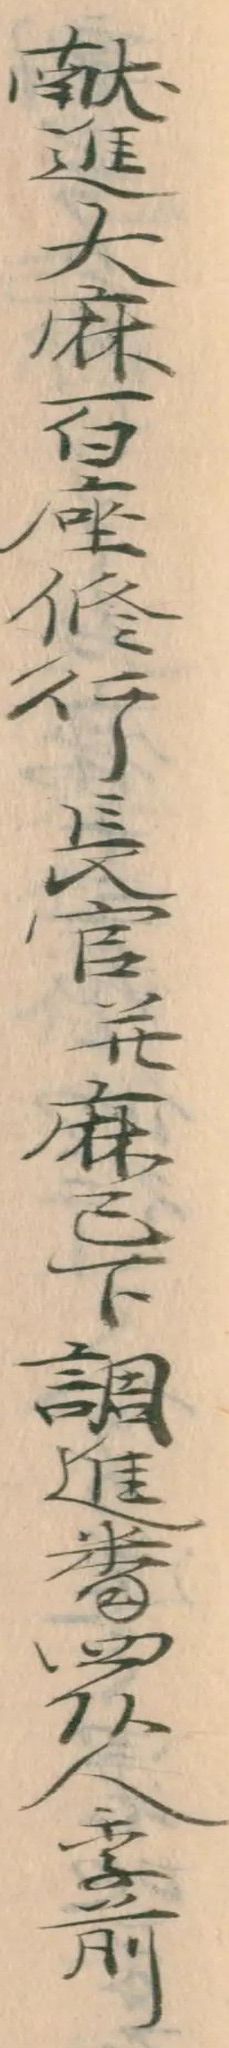献進大麻百座修行長官并麻已下調進番四頭人季前
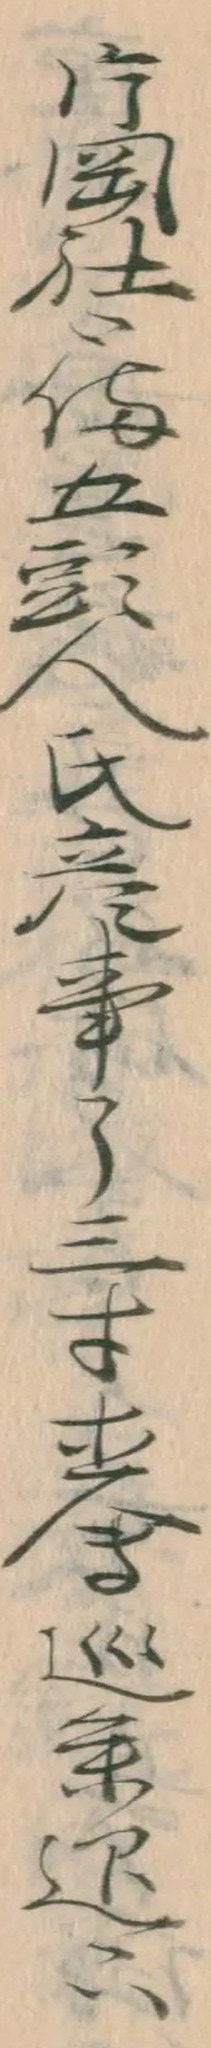片岡社御備五頭人氏産事了三寸直會巡参退候
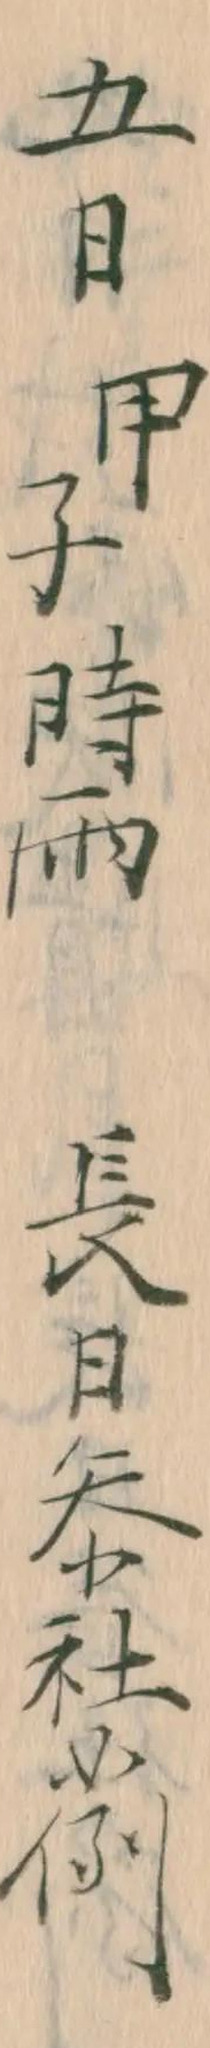五日甲子時雨長日参社如例
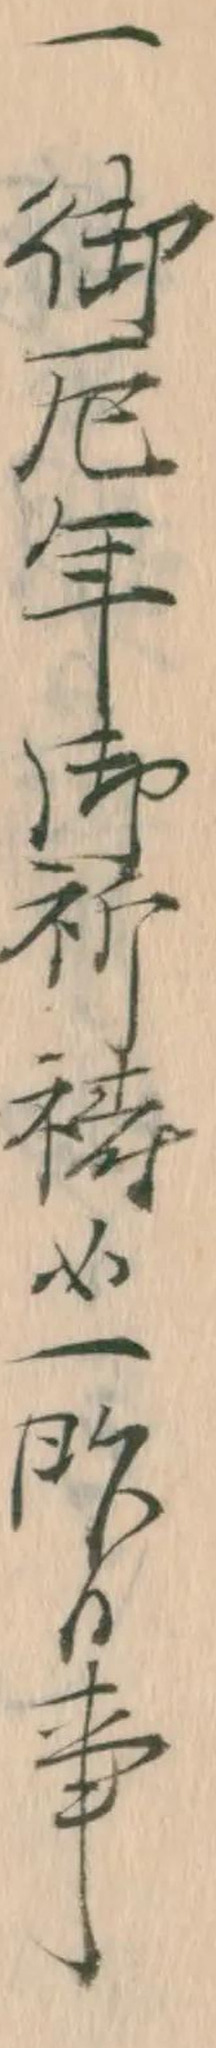一御厄年御祈祷如一昨日事
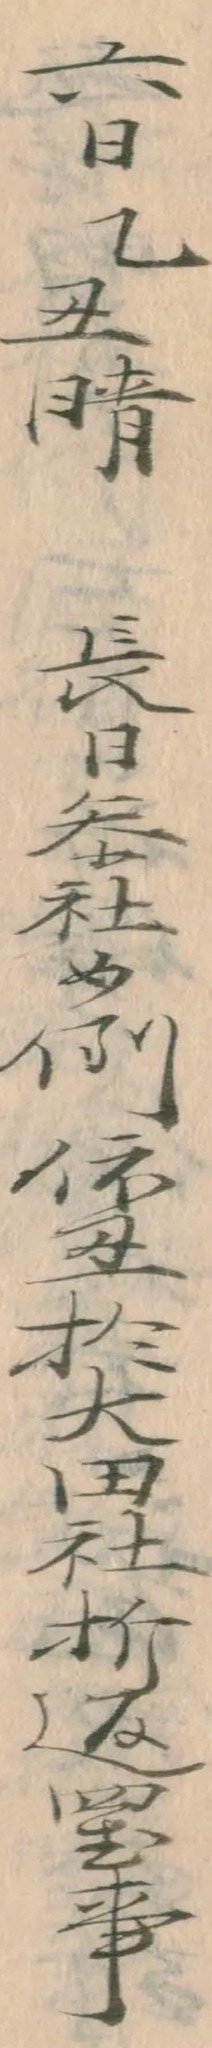六日乙丑晴長日参社如例依丑於大田社折返置事
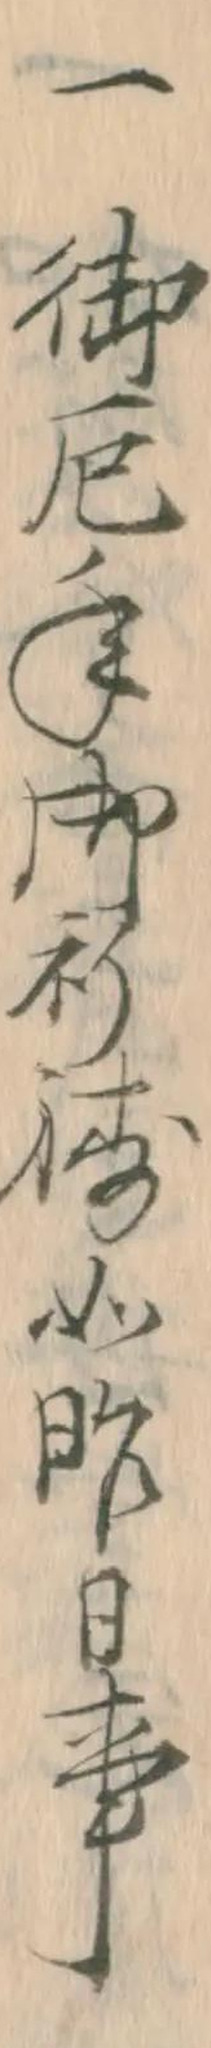一御厄年御祈祷如昨日事
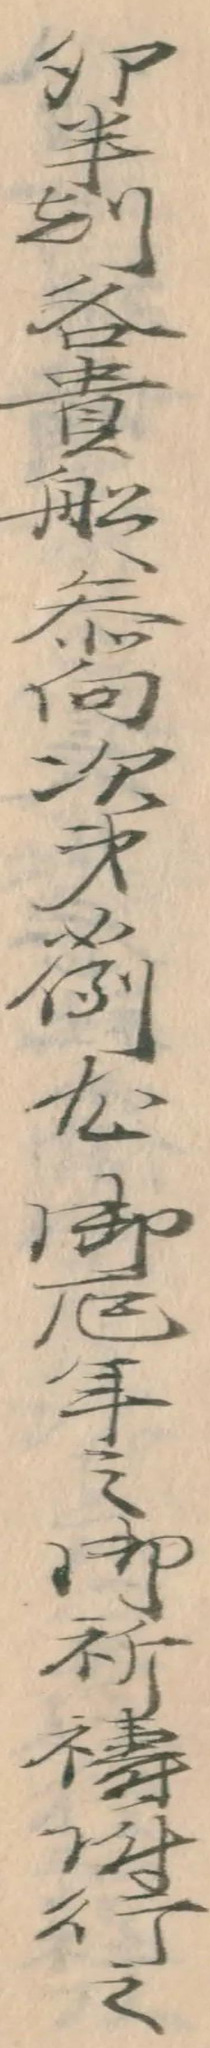一卯半刻各貴舩へ参向次第如例尤御厄年之御祈祷奉行附行也
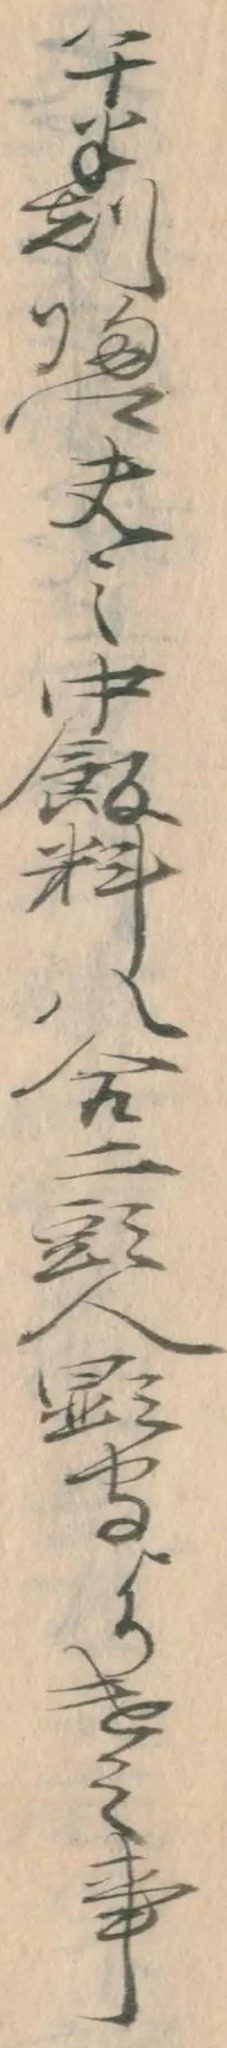午半刻帰郷夫々中飯料八合二頭人顕守より遣之事
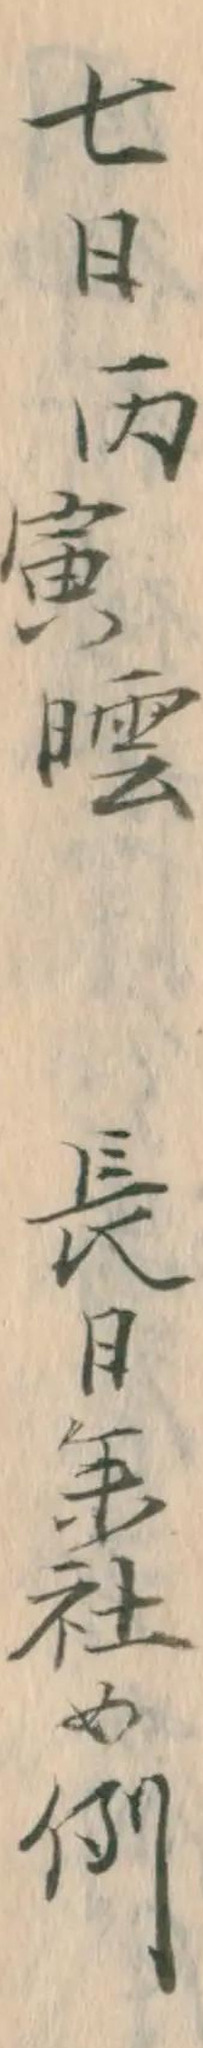七日丙寅曇長日参社如例
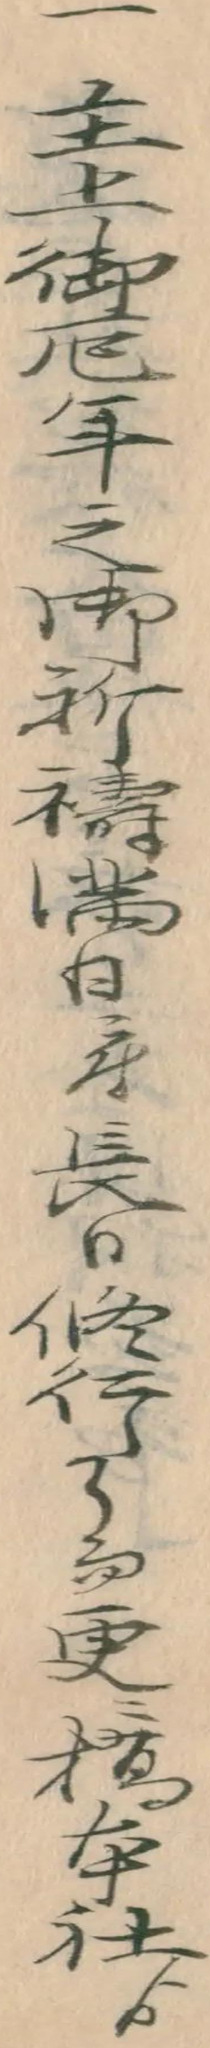一主上御厄年之御祈祷満日ニ付長日修行了而更ニ橋本社ゟ

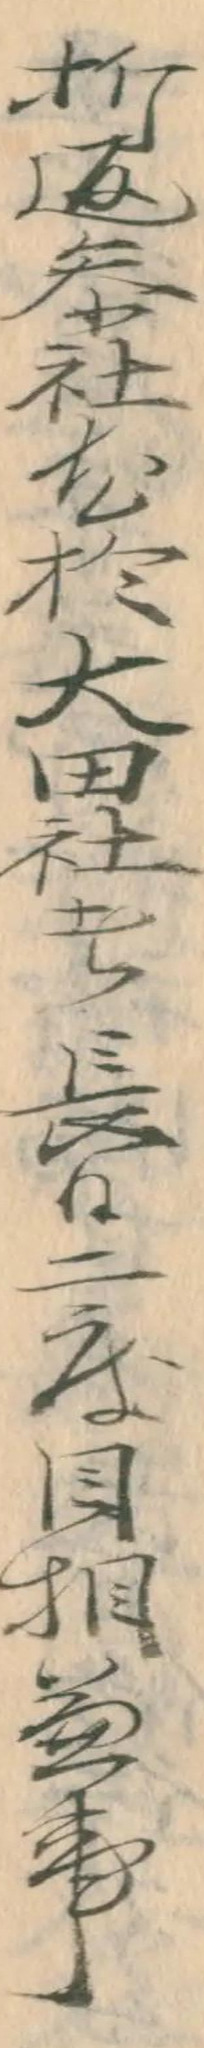折返参社尤於大田社は長日二度目相兼事
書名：賀茂社記録. 第74冊
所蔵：国立国会図書館 National Diet Library, JAPAN
